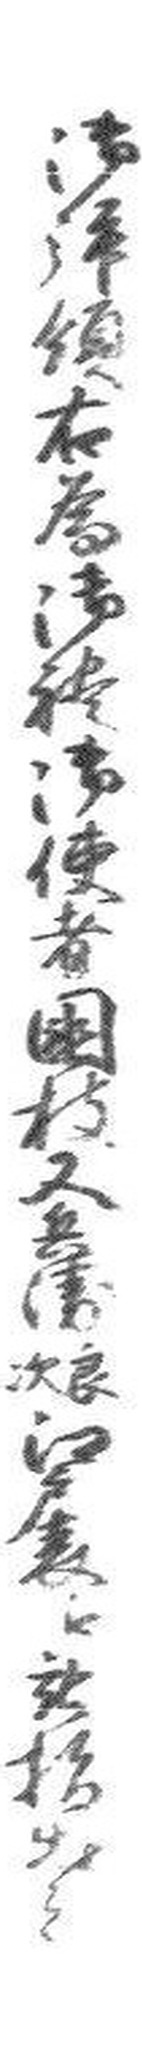御拝領右為御礼御使者国枝又兵衛良次江戸表江被指出之
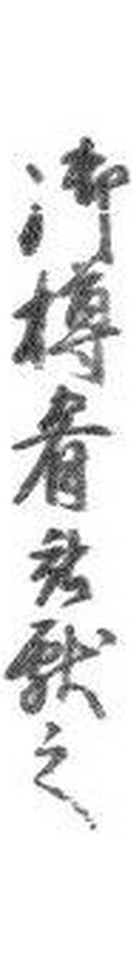御樽肴被献之
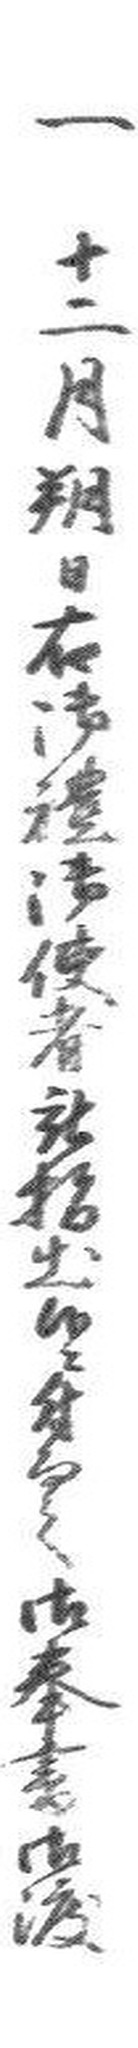一十二月朔日右御礼御使者被指出候ニ付而之御奉書御渡
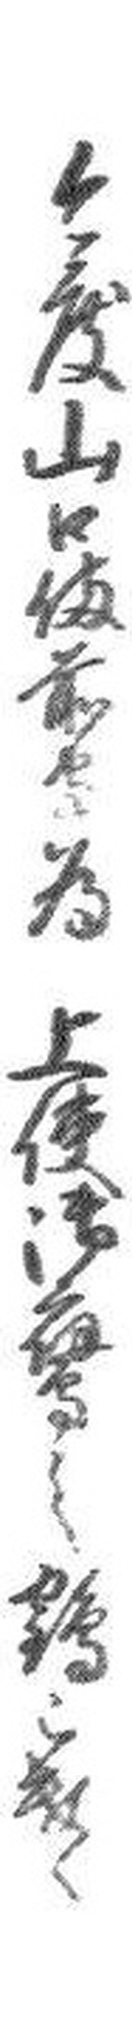今度山口備前守為上使御鷹之鶴被遣候
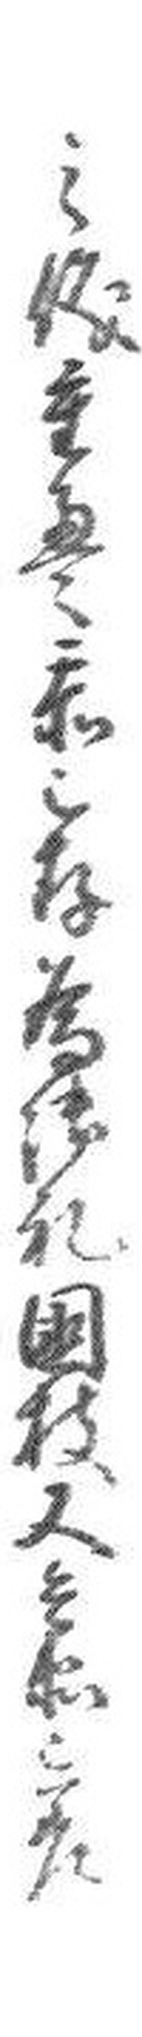之儀重畳忝被存為御礼国枝又兵衛被差
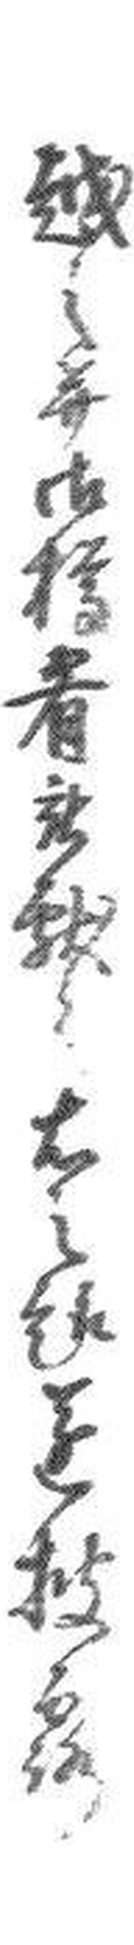越之并御樽肴被献之右之趣遂披露
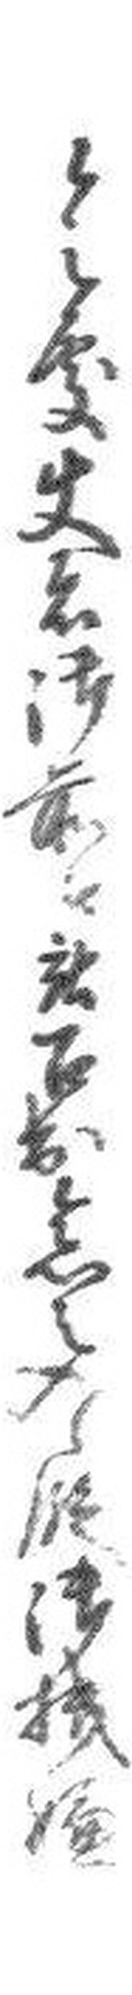候之処使者御前江被召出念之入候段御機嫌

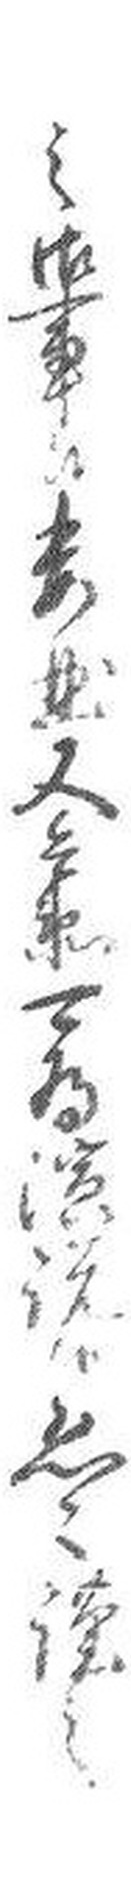之御事候委曲又兵衛可為演説候恐々謹言
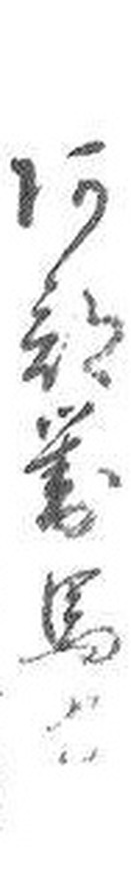阿部対馬守
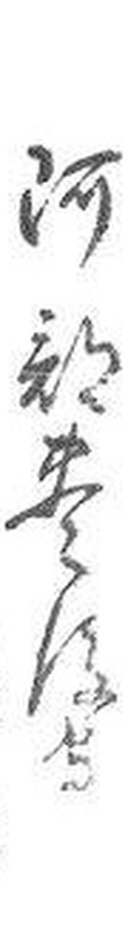阿部豊後守
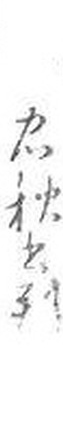忠秋書判
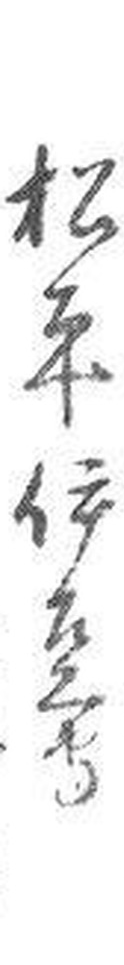松平伊豆守
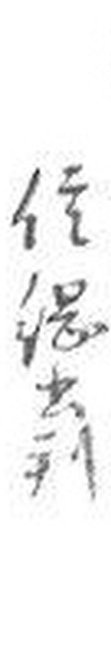信綱書判
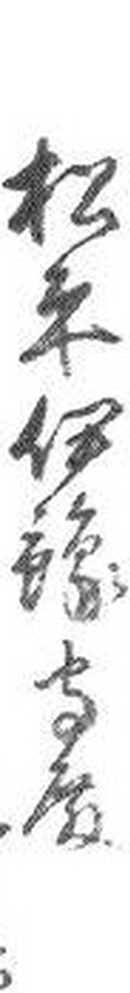松平伊予守殿
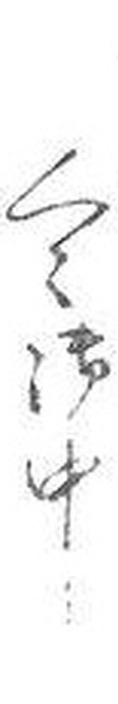人々御中
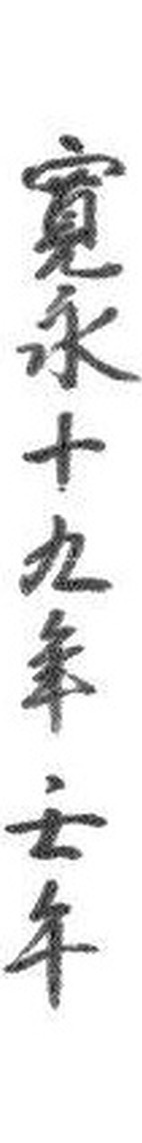寛永十九年壬午
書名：家譜 四 忠昌公 従寛永七年到正保四年
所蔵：福井県文書館 Fukui Prefectural Archives
